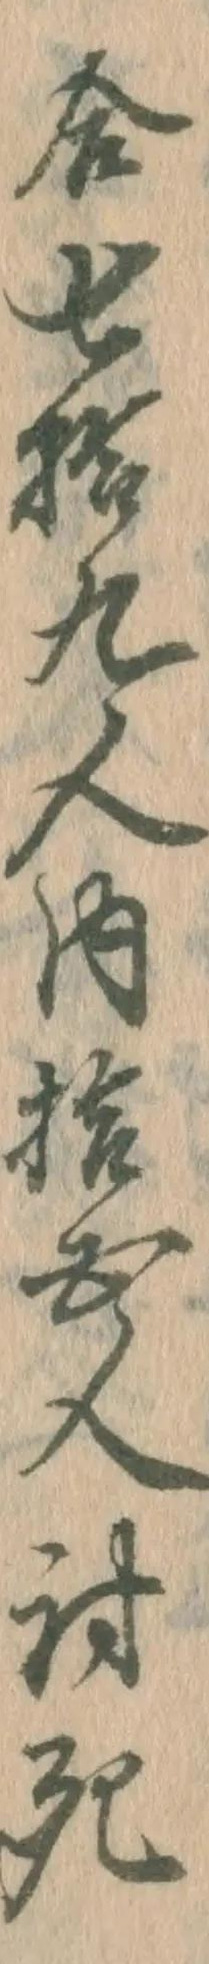合七拾九人内拾五人討死
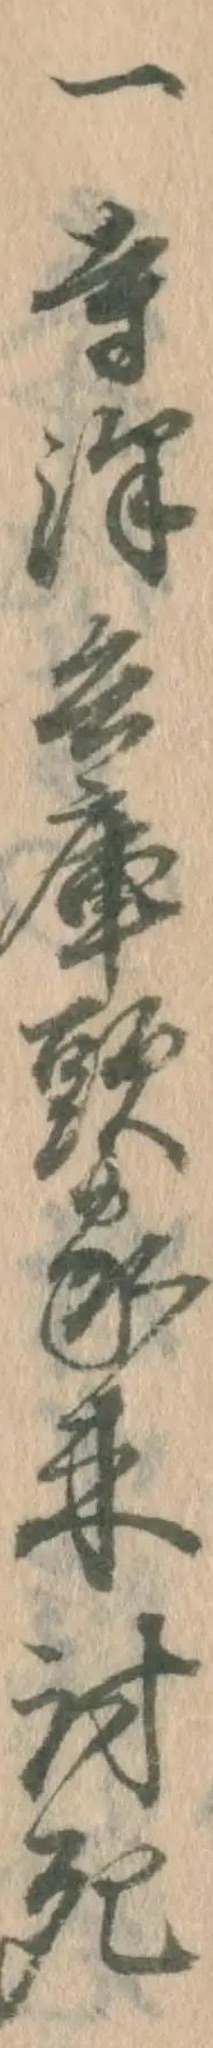一寺沢兵庫頭家来討死
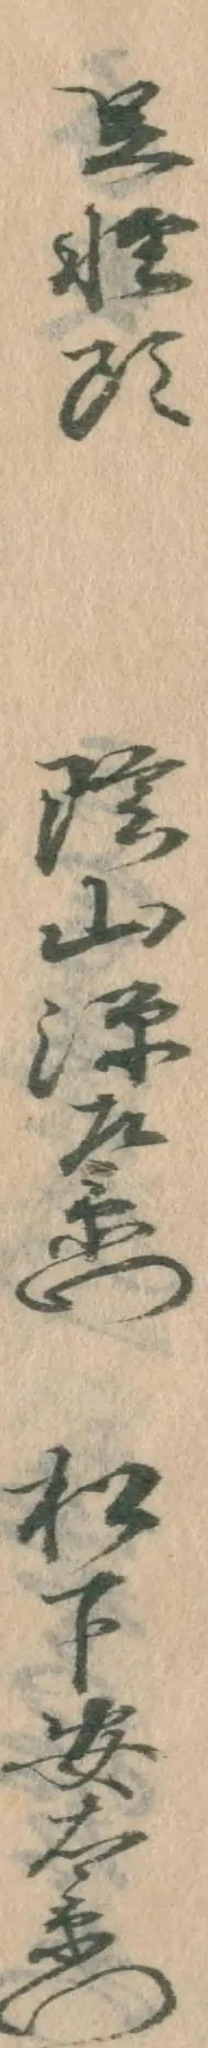足軽頭陰山源左衛門松下安右衛門
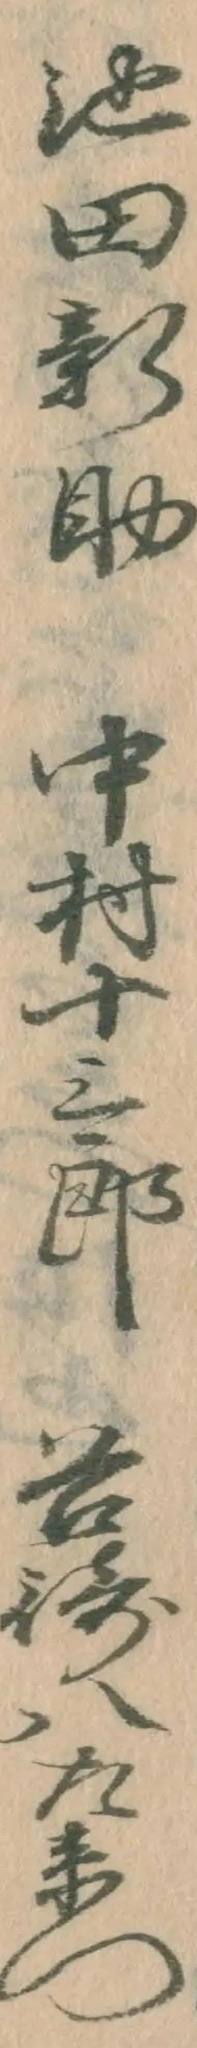池田新助中村十三郎谷崎八左衛門

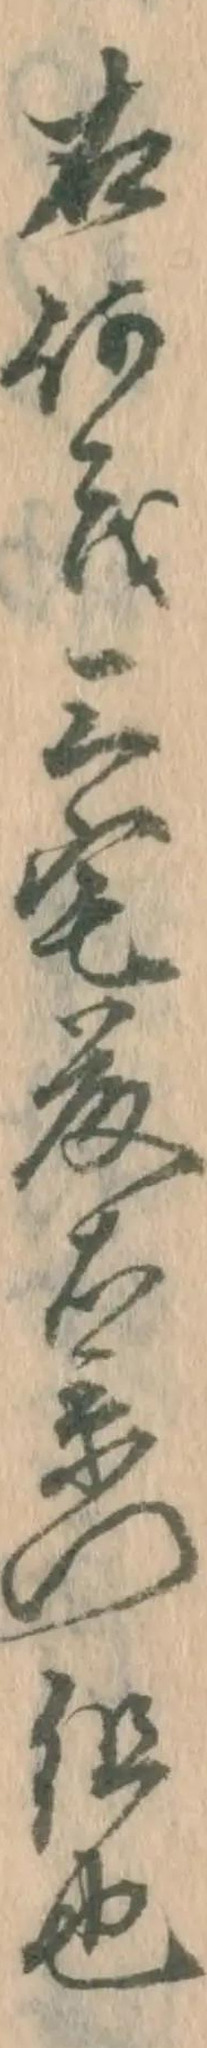右何茂三宅藤右衛門組也
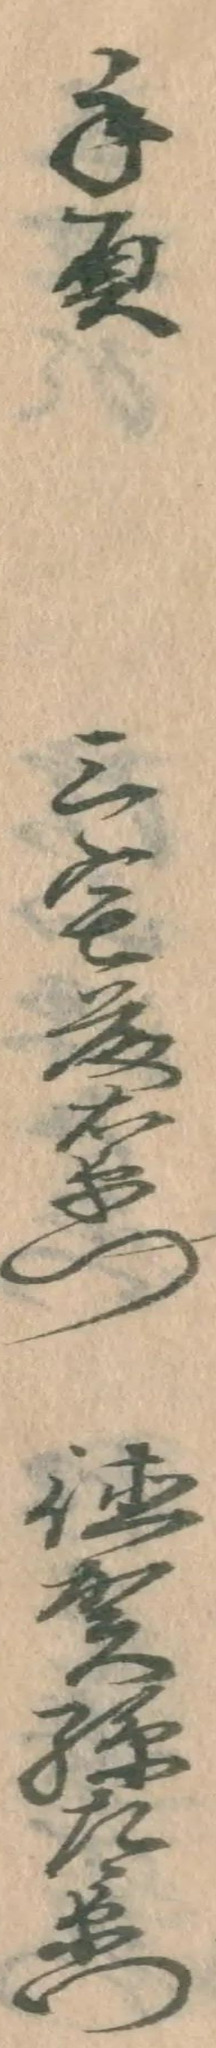手負三宅藤右衛門徳賀孫左衛門
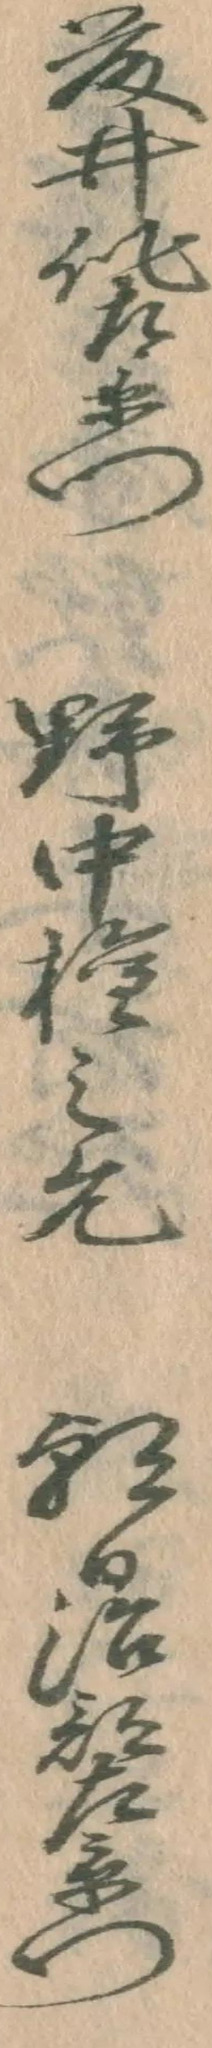藤井作左衛門野中権之允朝日治部左衛門
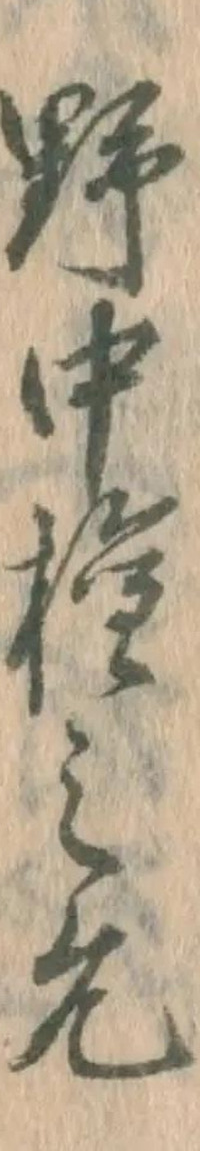牧口権之允
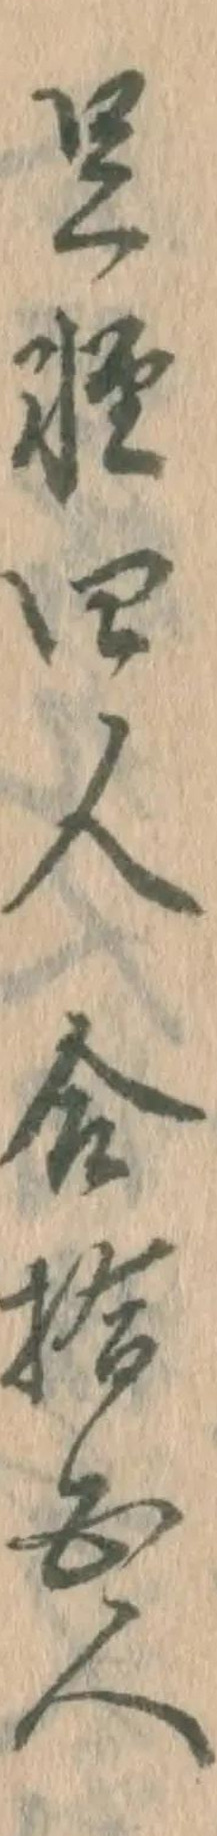足軽四人合拾五人
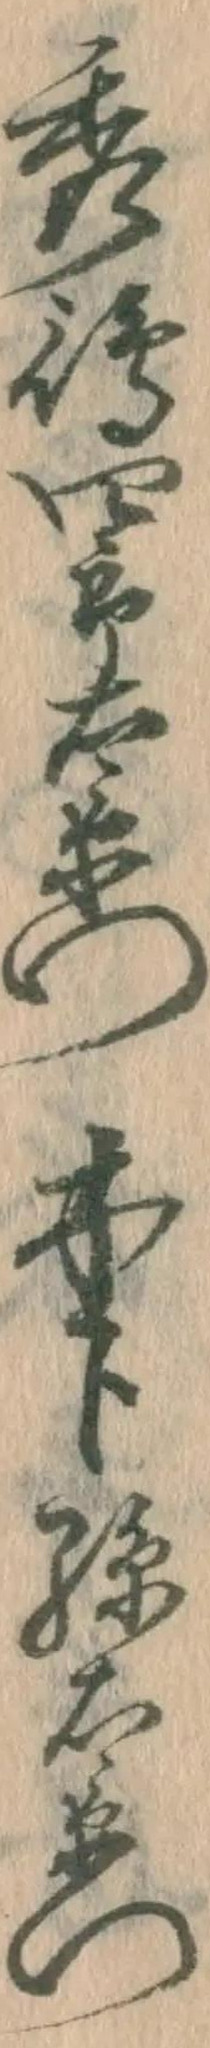秀島四郎右衛門木下孫右衛門
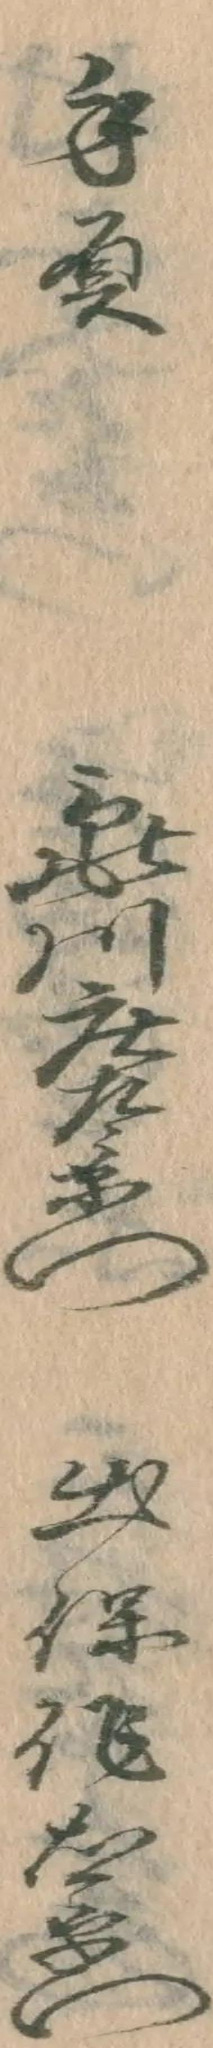手負亀川庄左衛門出保作右衛門
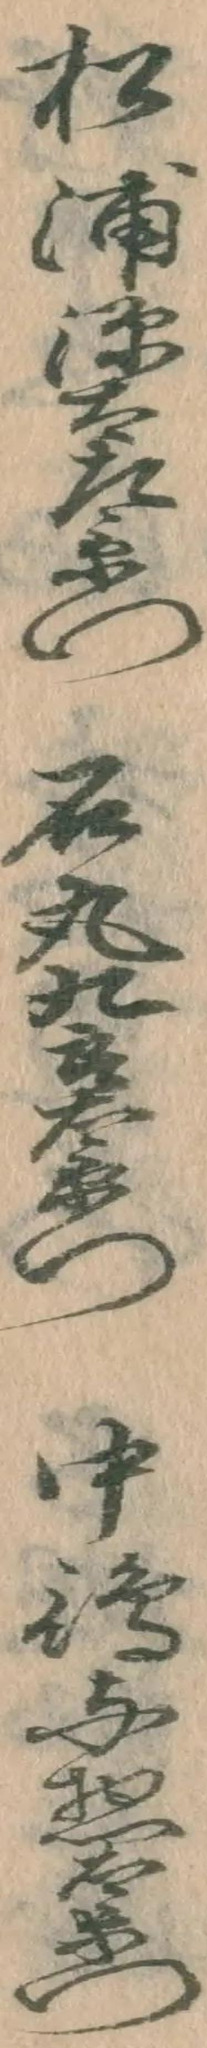松浦源太左衛門石丸九郎右衛門中島与惣右衛門
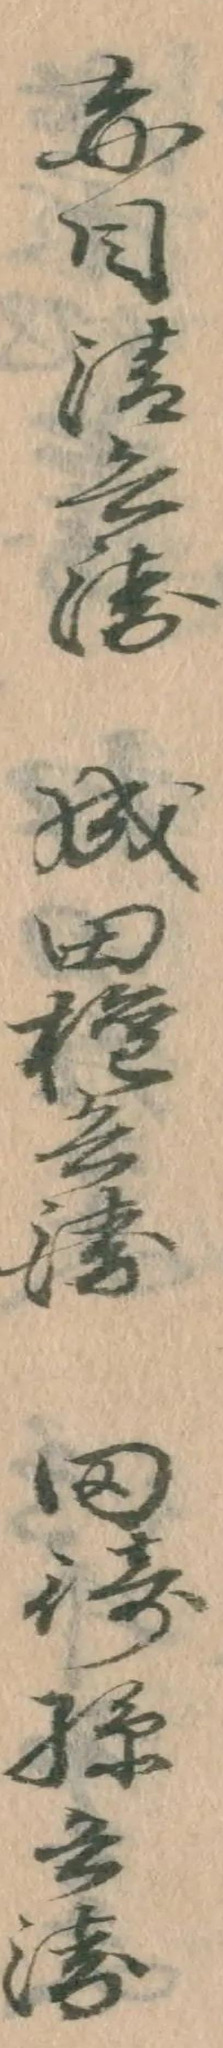赤目清兵衛城田権兵衛田崎孫兵衛
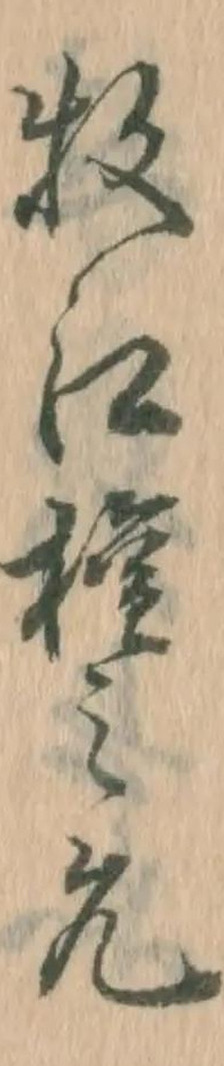牧口権之允
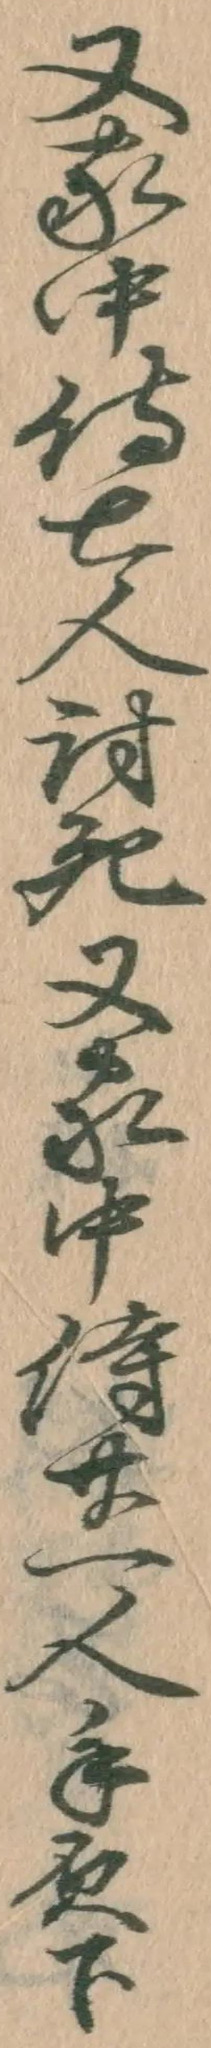又家中侍七人討死又家中侍廿一人手負下
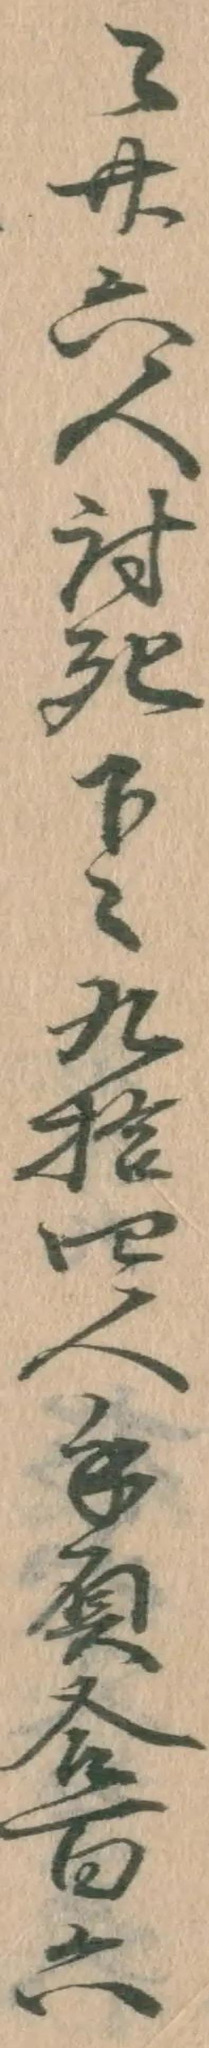々廿六人討死下々九拾四人手負合百六
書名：切支丹御退治記 49巻. [7]
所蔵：国立国会図書館 National Diet Library, JAPAN
